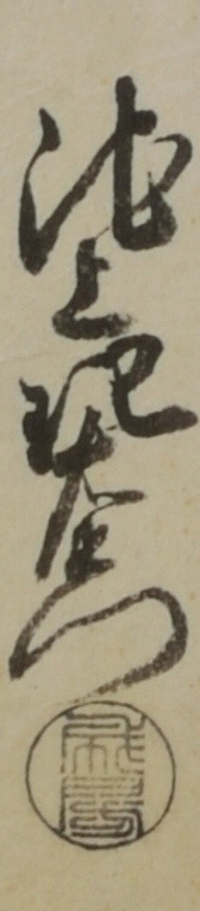池上理右衛門㊞
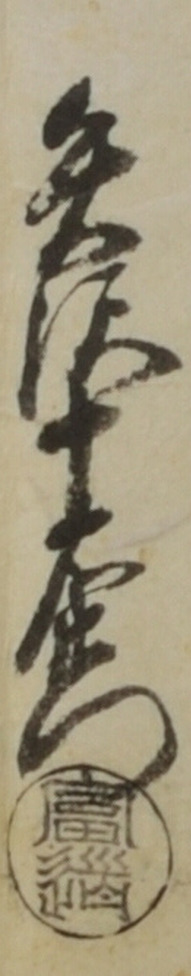矢沢十右衛門㊞
